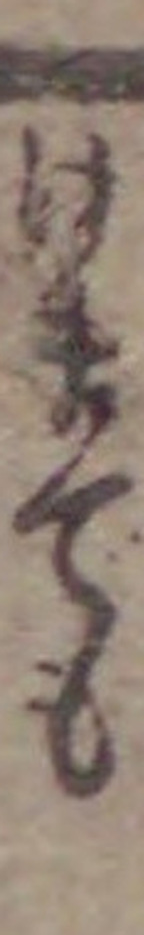けまでも
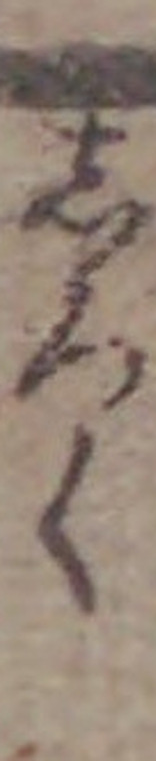しろく
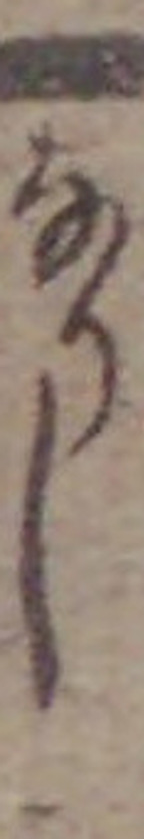なりし
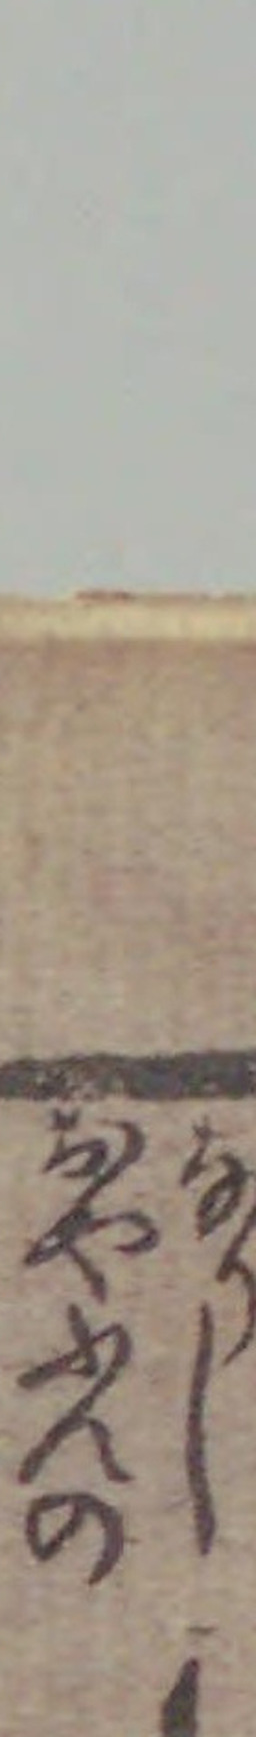おやふんの
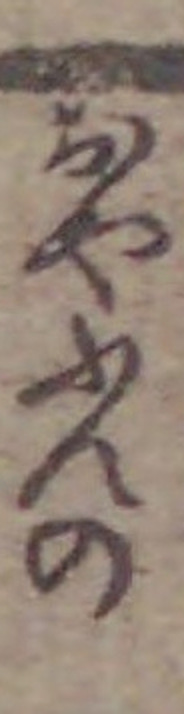おやふんの
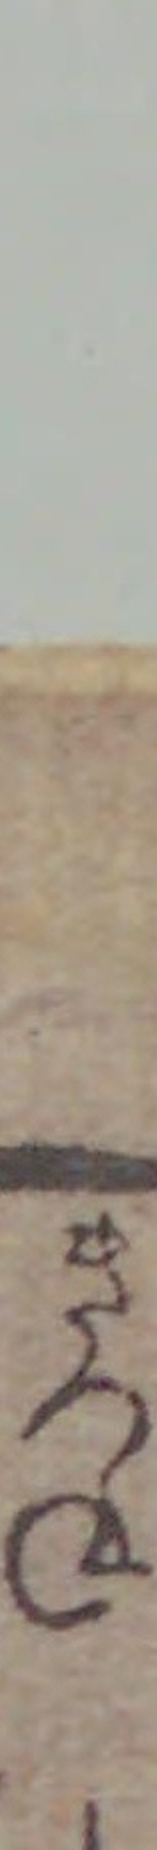きつね
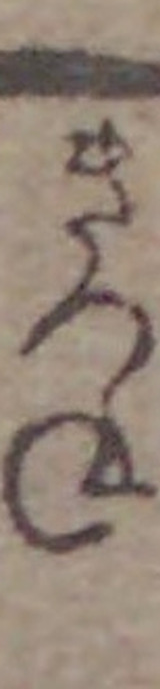きつね
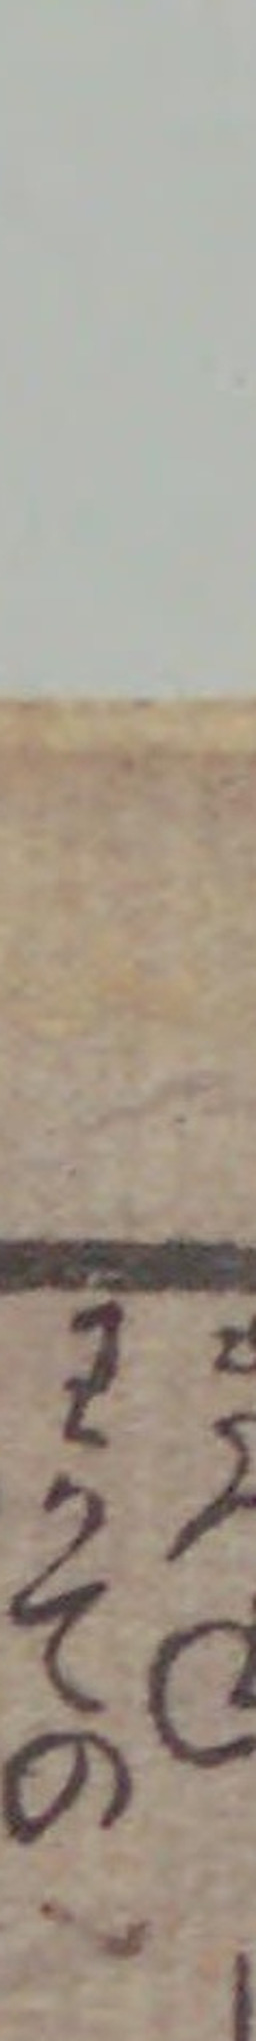わかての
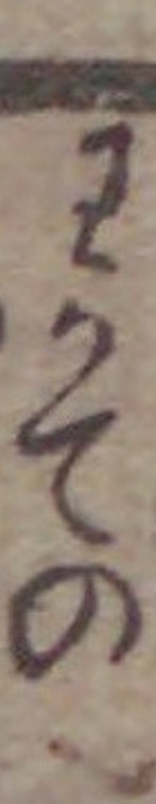わかての
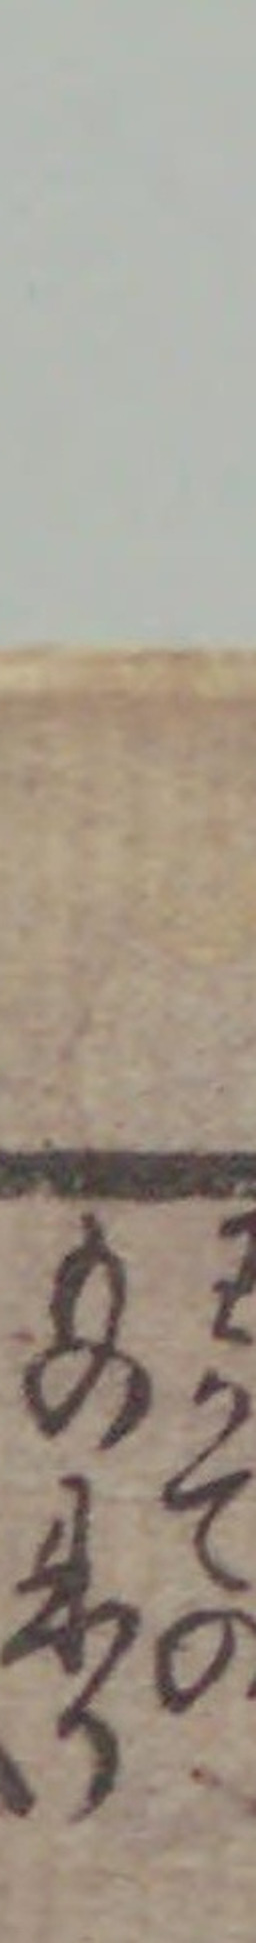もの来り
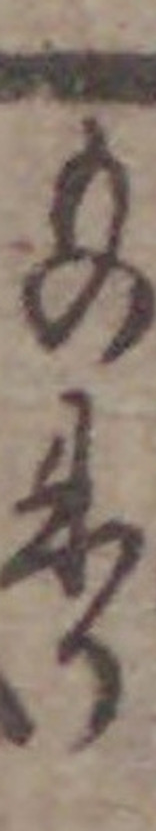もの来り
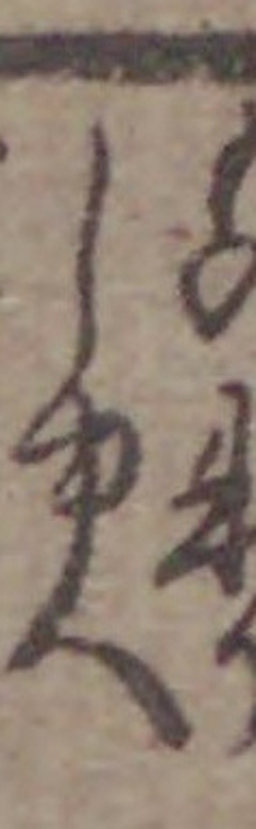しゆへ
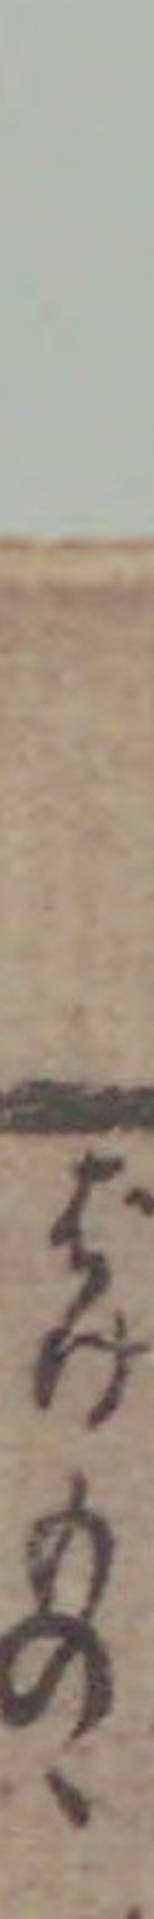ばけものゝ
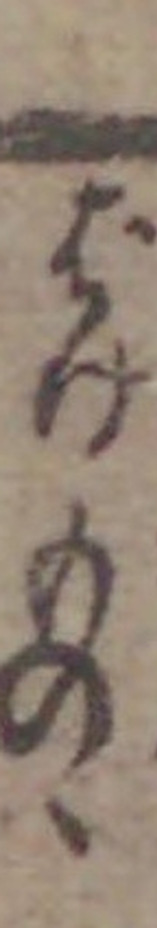ばけものゝ
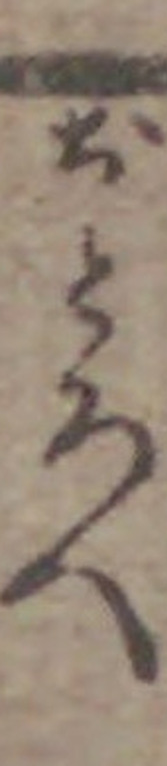おとろへ
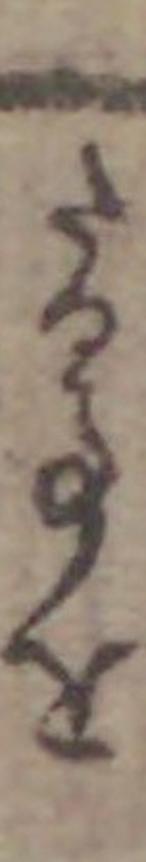たる事を
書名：化物鼻がひしげ 2巻
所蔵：国立国会図書館 National Diet Library, JAPAN
